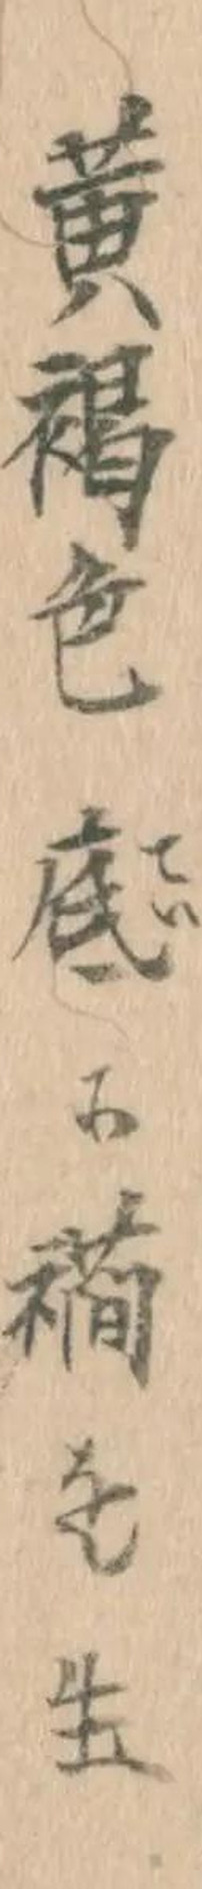黄褐色底にを生
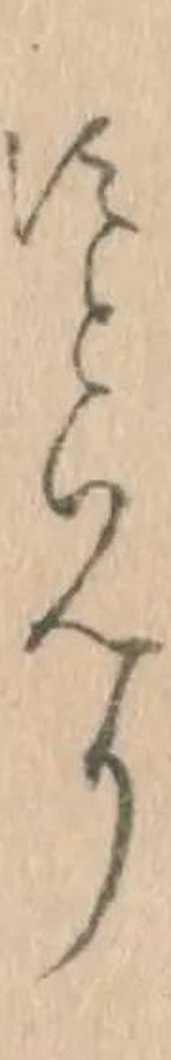すといへり

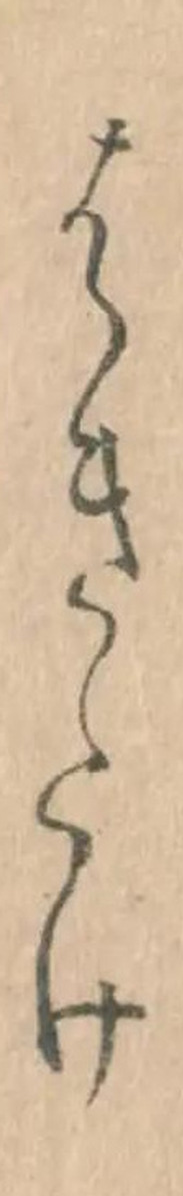はきたけ
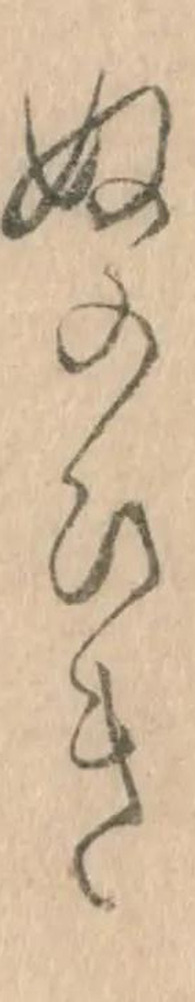ぬのひき
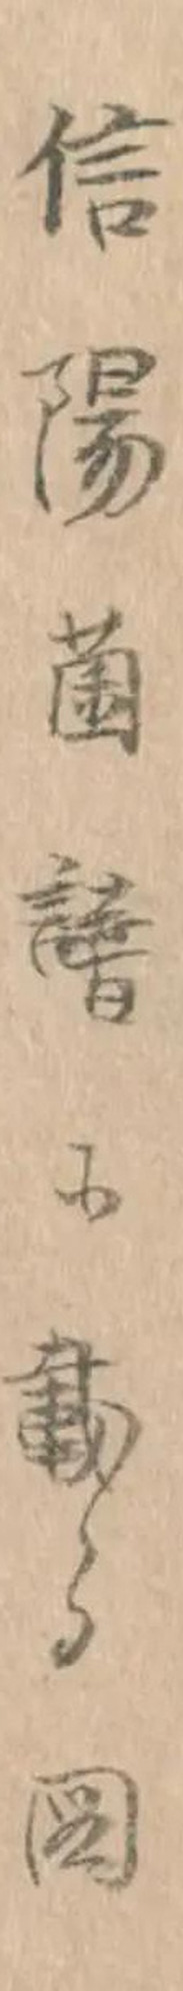信陽菌譜に載る図
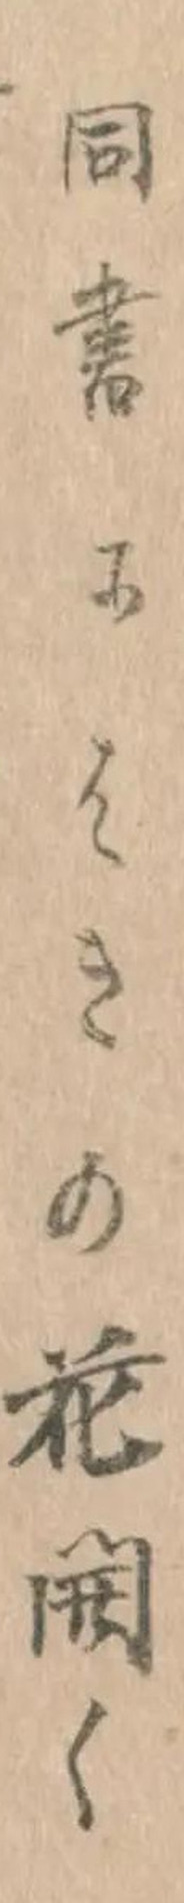同書にはきの花開く
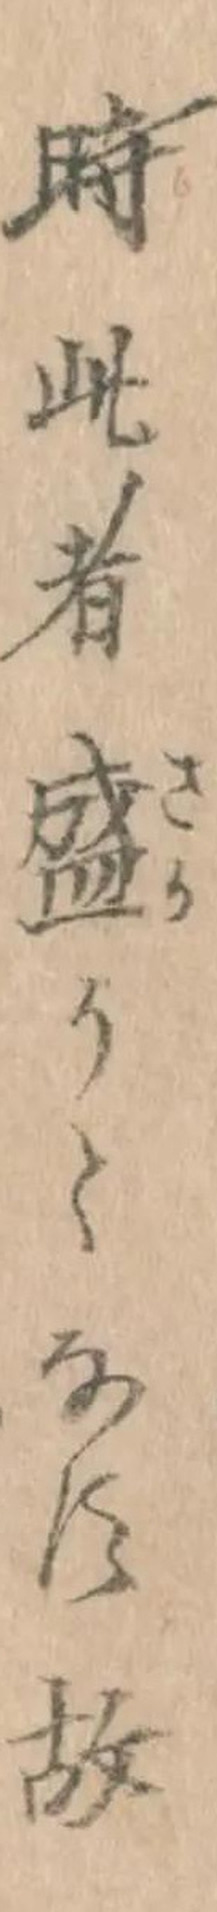時此者盛りとなす故
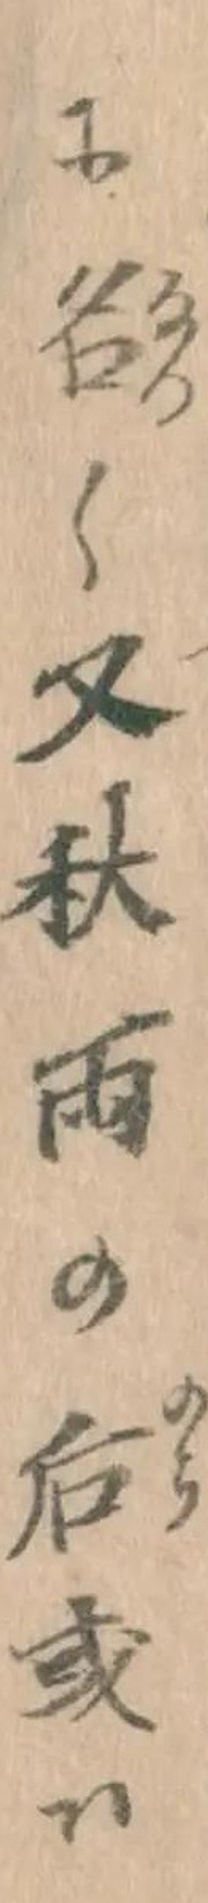に名く又秋雨の后或は
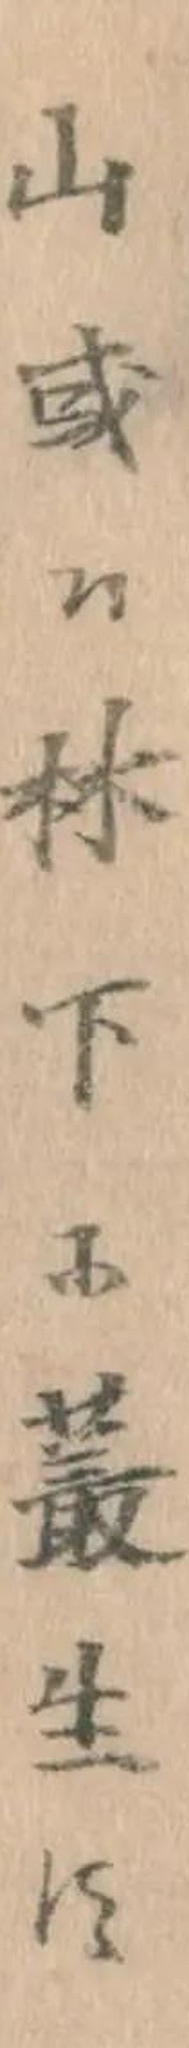山或は林下に叢生す
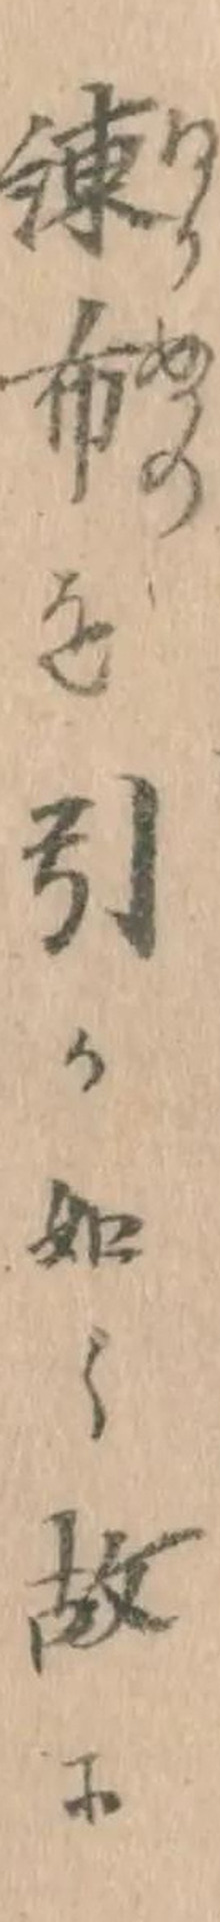練布を引か如く故に
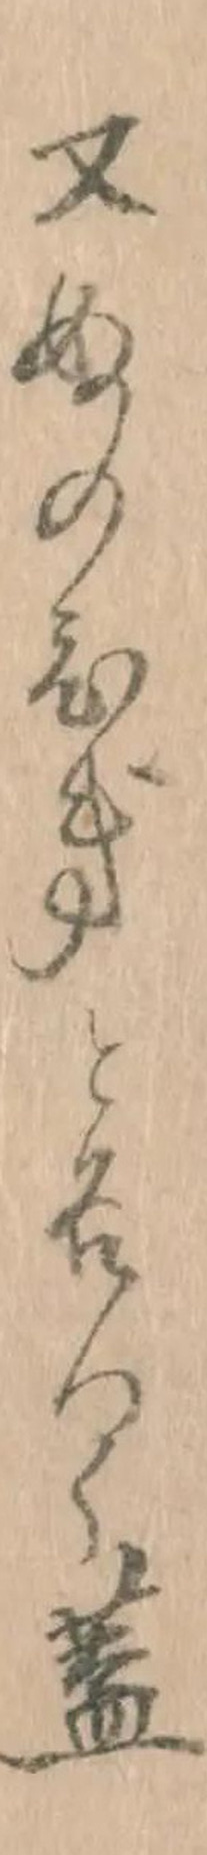又ぬのひきと名つく蓋
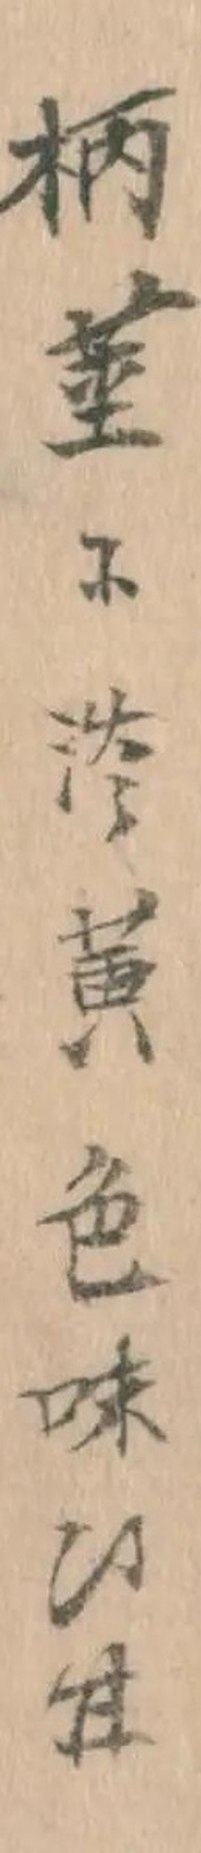柄茎に淡黄色味ひ甘
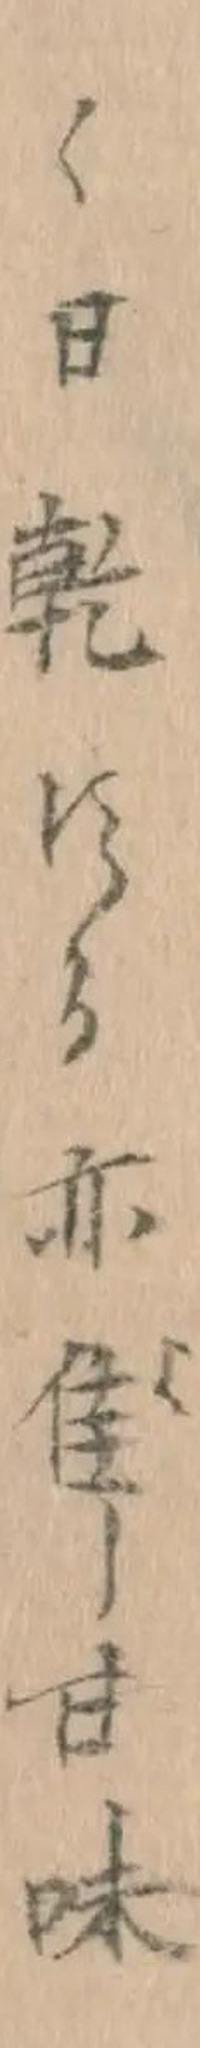く日乾する亦佳し甘味
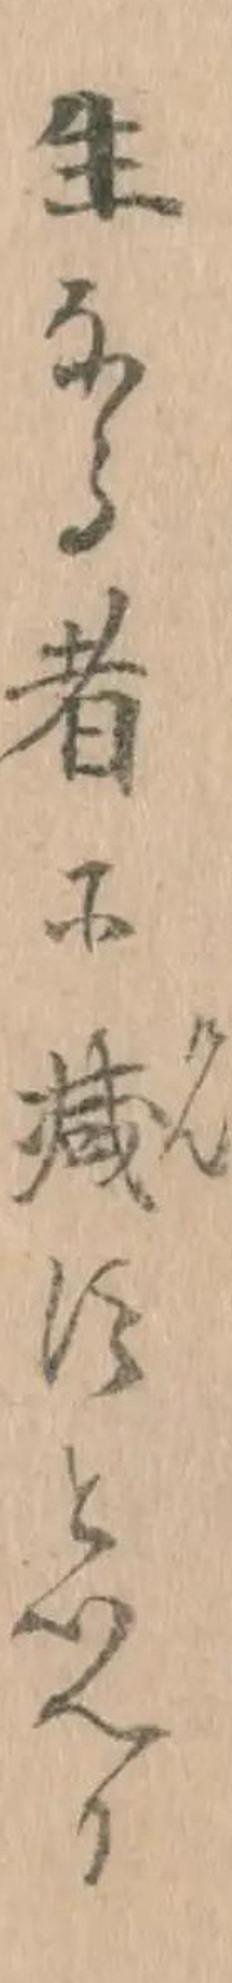生なる者に減すといへり
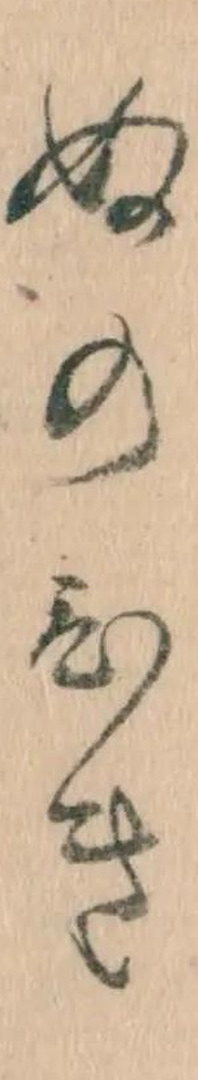ぬのひき
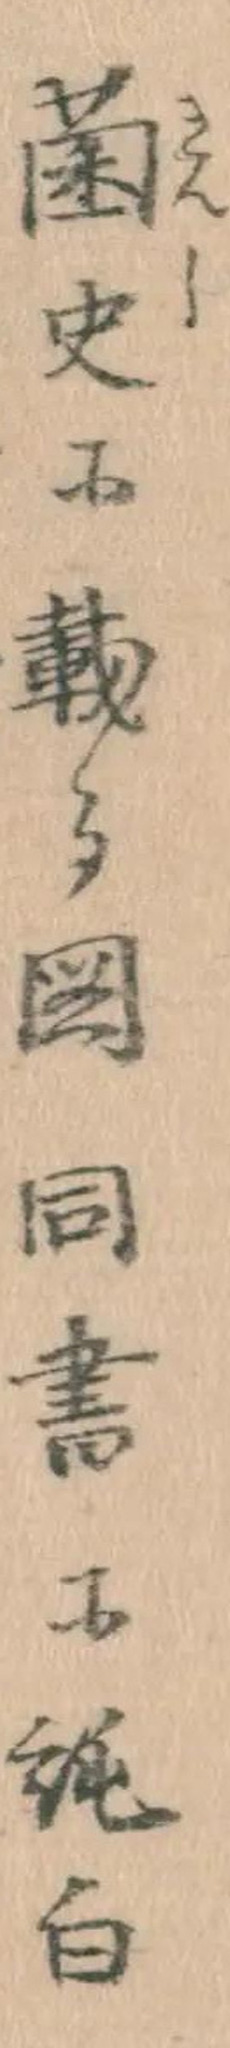菌史に載る図同書に純白
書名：本草図譜. 巻58-60
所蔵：国立国会図書館 National Diet Library, JAPAN
